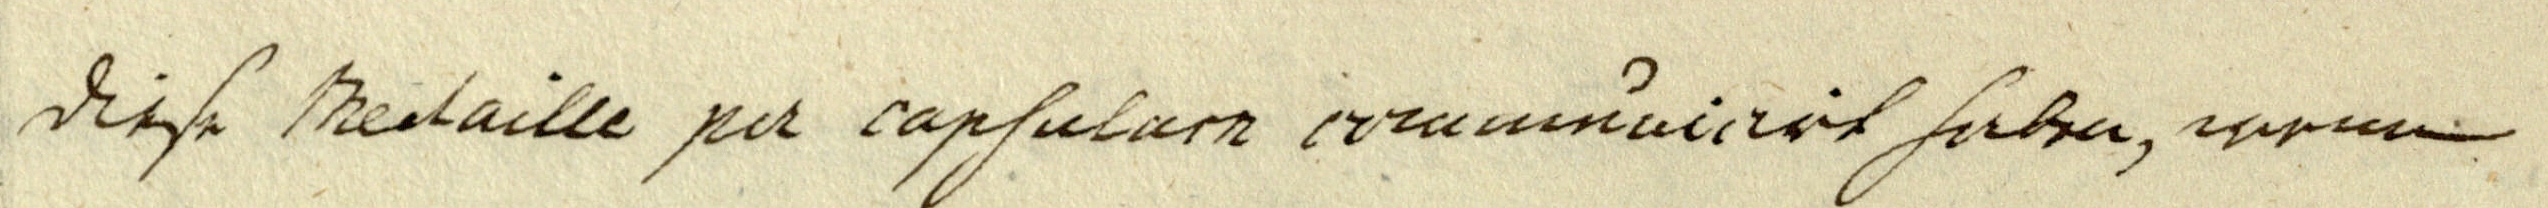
diese Medaille per capsulam communicirt haben, wenn
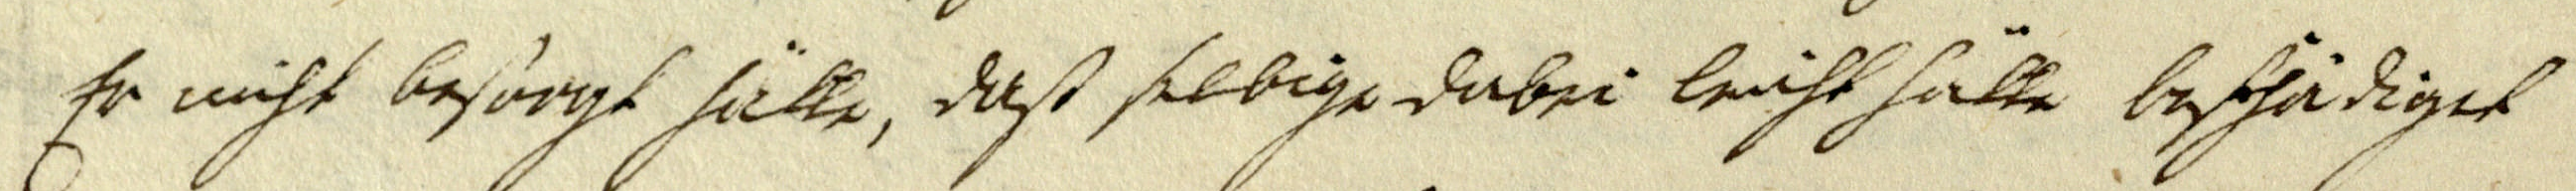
Er nicht besorgt hätte, daß selbige dabei leicht hätte beschädiget
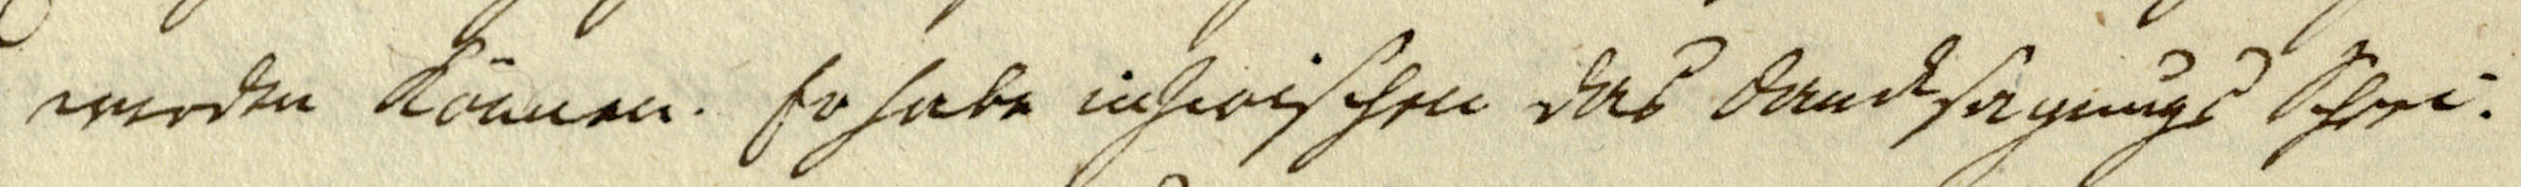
werden können. Er habe inzwischen das Dancksagungs Schrei¬
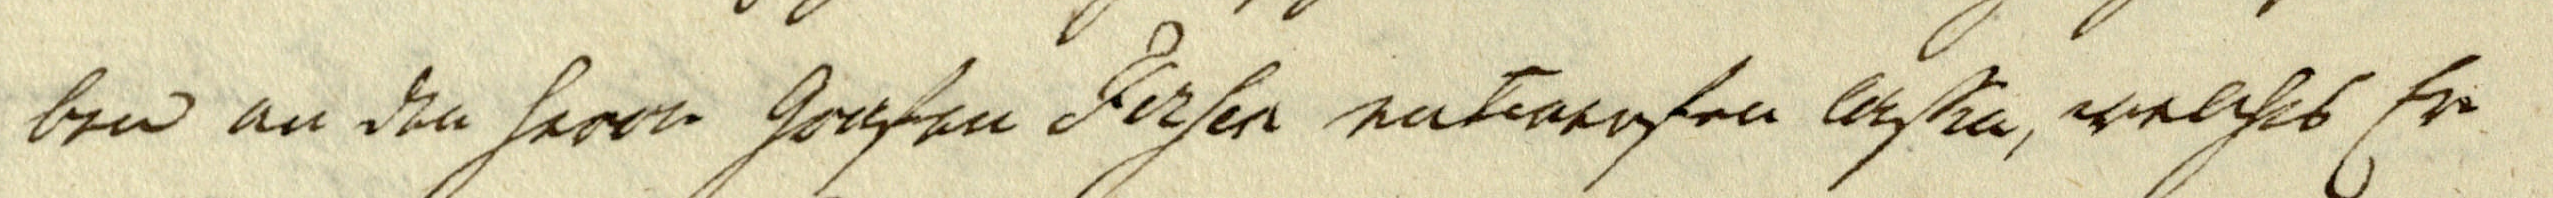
ben an den herrn Grafen Fersen entwerfen lassen, welches Er
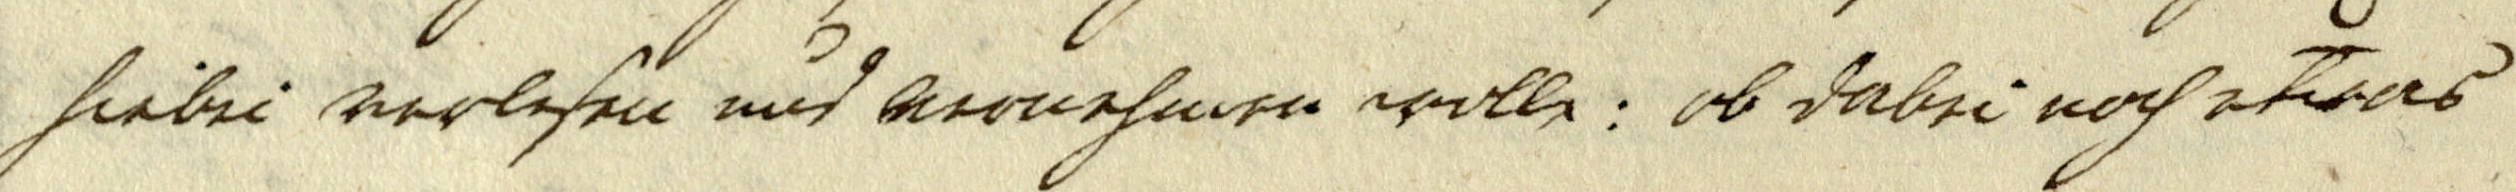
hiebei vorlesen und vernehmen wolle: ob dabei noch etwas
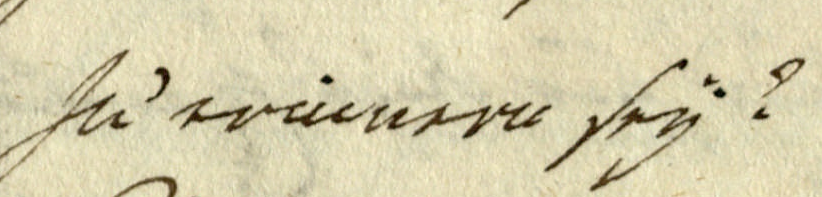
zu erinnern seÿ?
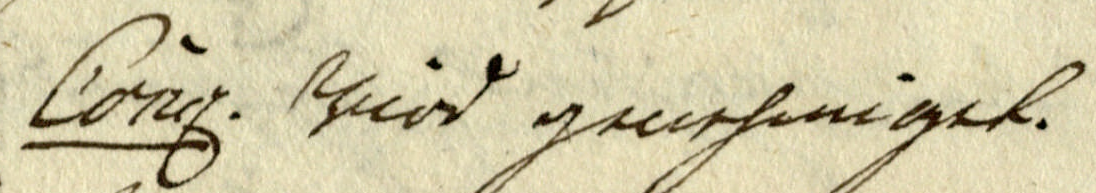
Concl. Wird genehmiget.
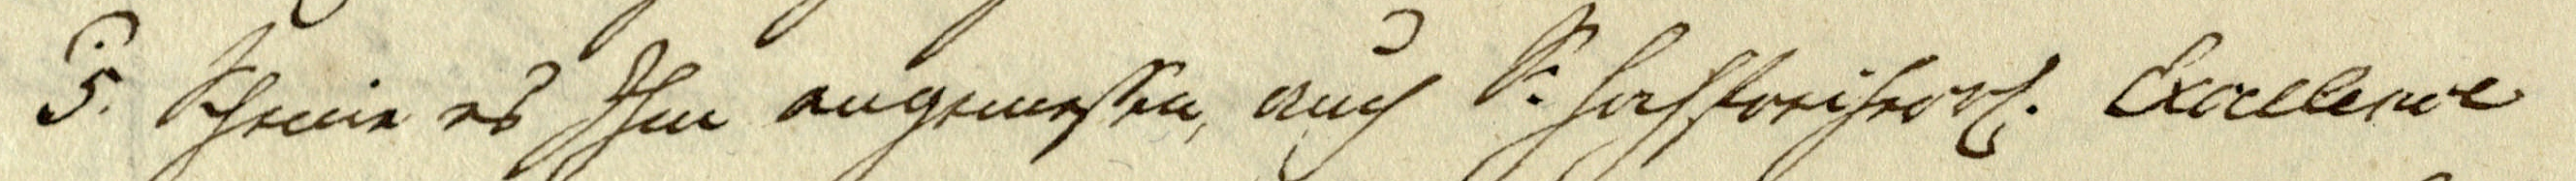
5. Scheine es Ihm angemessen, auch Sr. hochfreiherrl. Excellence
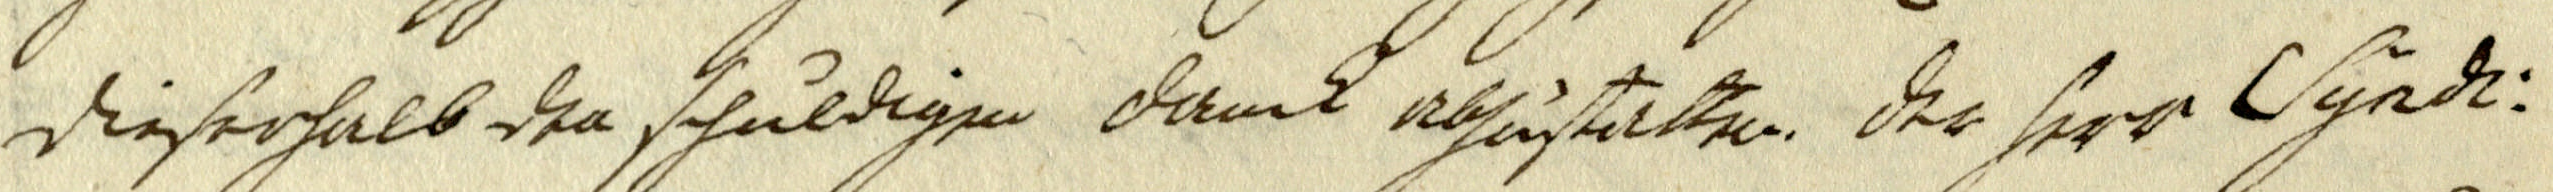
dieserhalb den schuldigen Danck abzustatten. Der herr Sÿndi¬
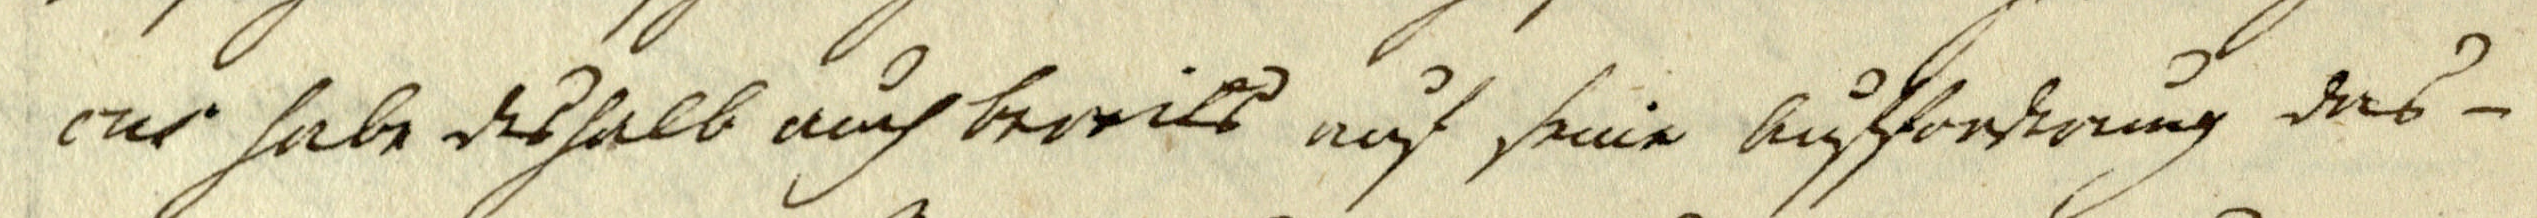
cus habe deshalb auch bereits auf seine Aufforderung das -
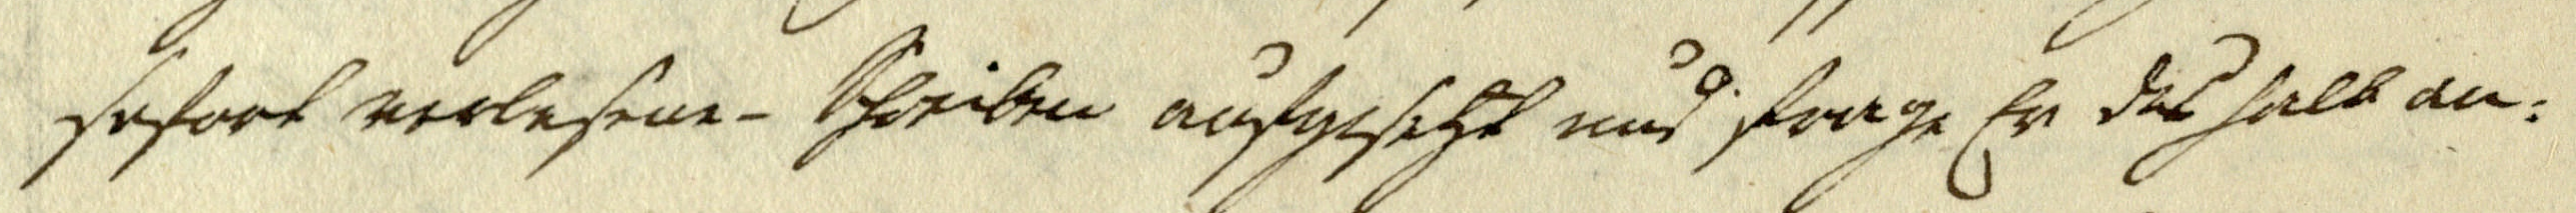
sofort verlesene - Schreiben aufgesetzt und frage Er deshalb an:
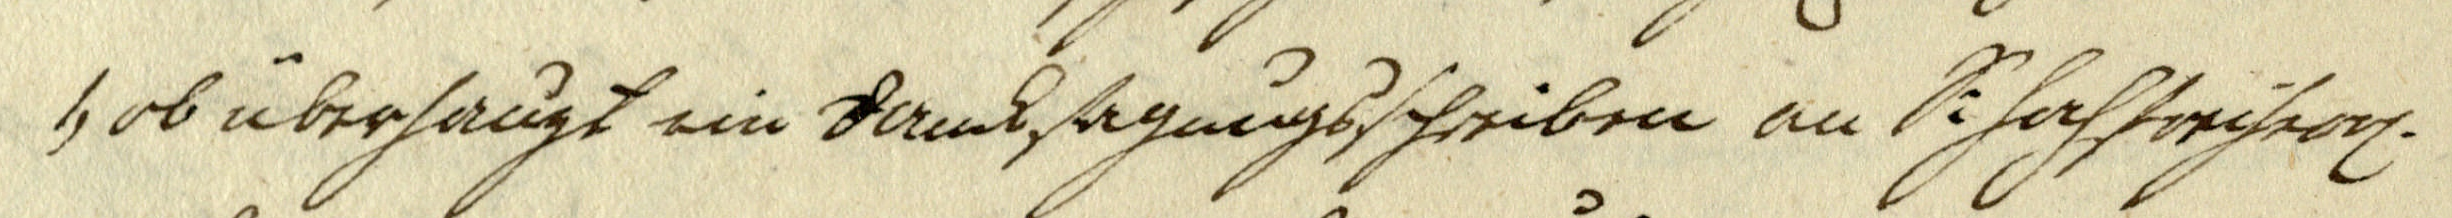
1, ob überhaupt ein Dancksagungsschreiben an Sr. hochfreiherrl.
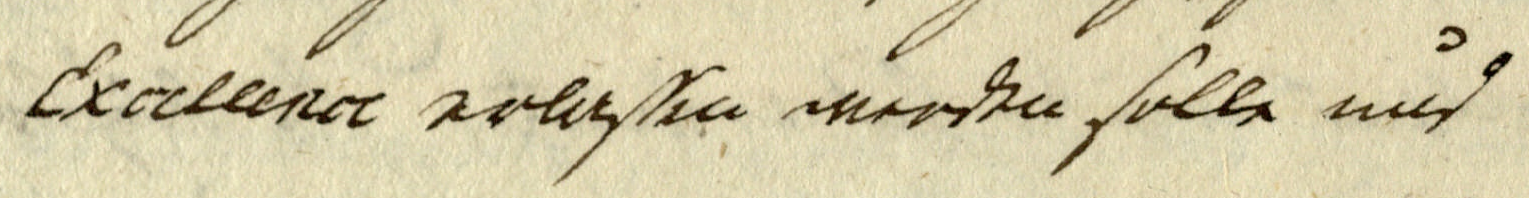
Excellence erlassen werden solle und
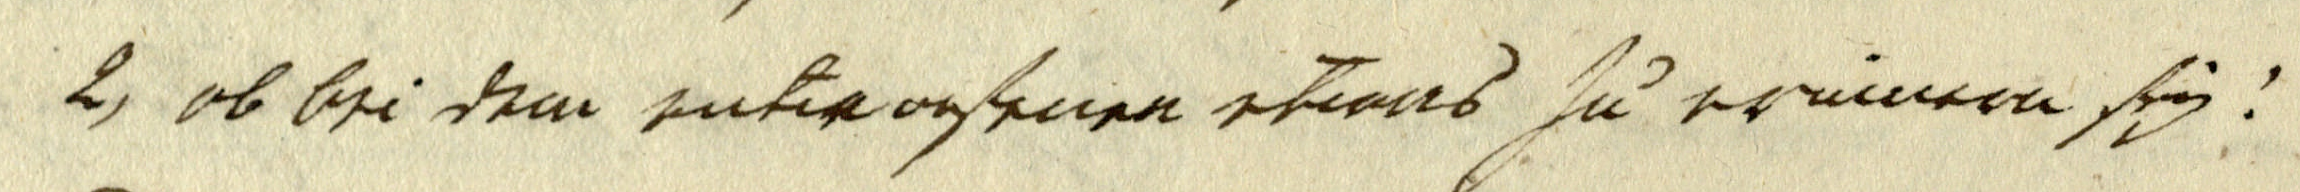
2, ob bei dem entworfenen etwas zu erinnern seÿ?
